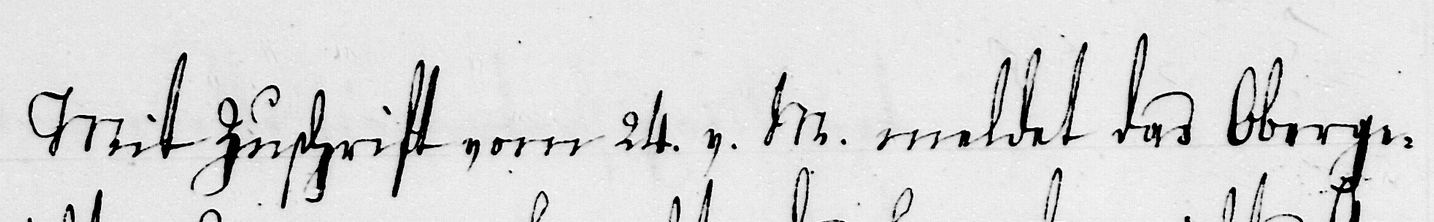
Mit Zuschrift vom 24. v. M. meldet das Oberge¬
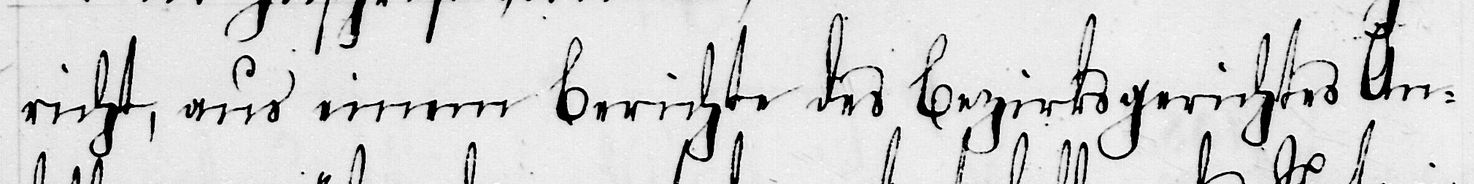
richt, aus einem Berichte des Bezirksgerichtes An¬
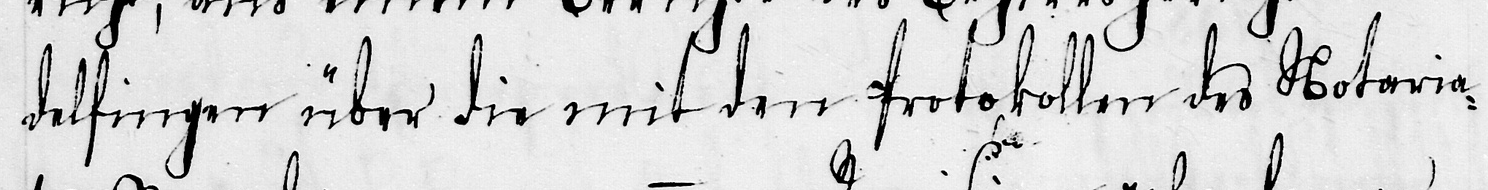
delfingen über die mit den Protokollen des Notaria¬
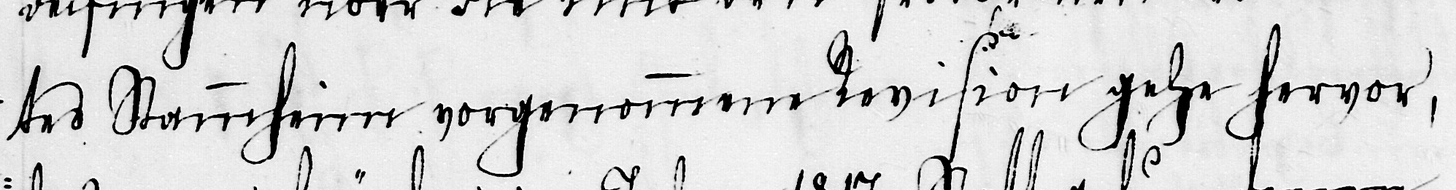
tes Stammheim vorgenommene Revision gehe hervor,
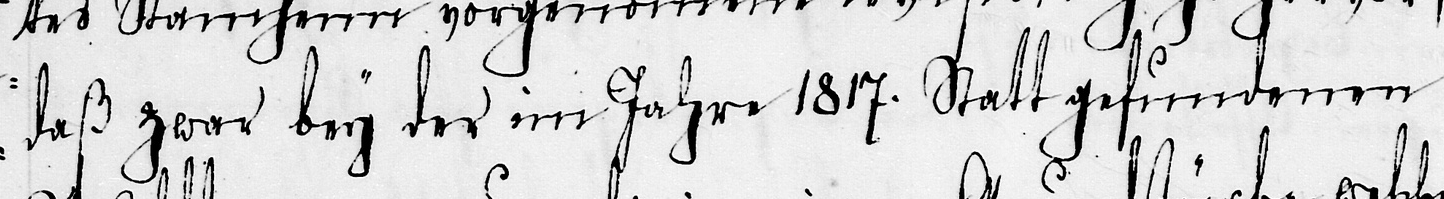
daß zwar bey der im Jahre 1817. Statt gefundenen
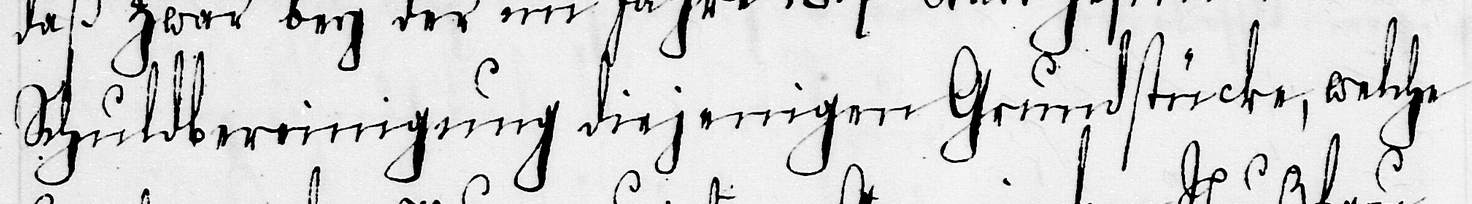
Schuldbereinigung diejenigen Grundstücke, welche
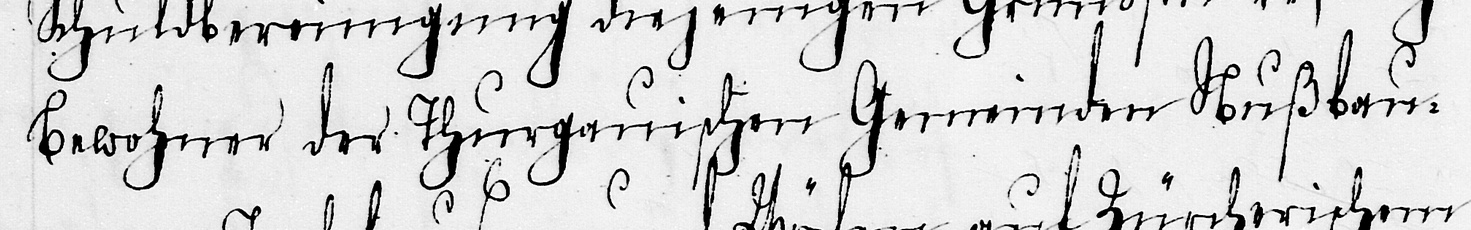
Bewohner der Thurgauischen Gemeinden Nußbau¬
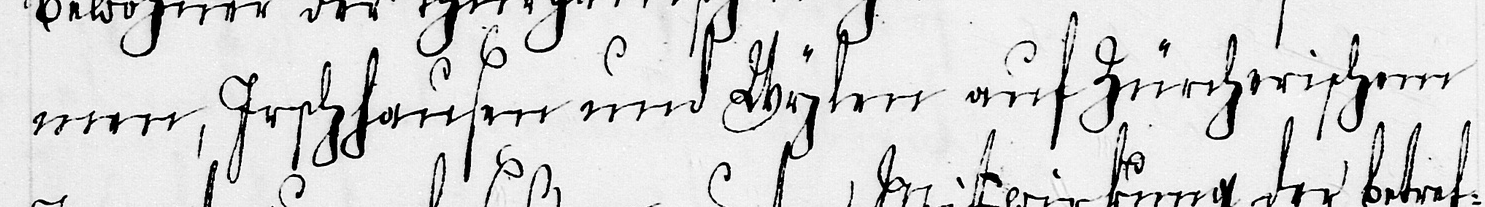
men, Irschhausen und Wylen auf Zürcherischem
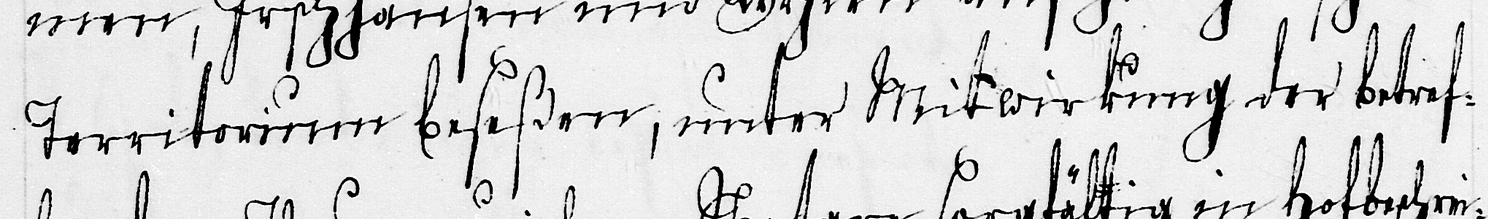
Territorium befaßen, unter Mitwirkung der betre¬
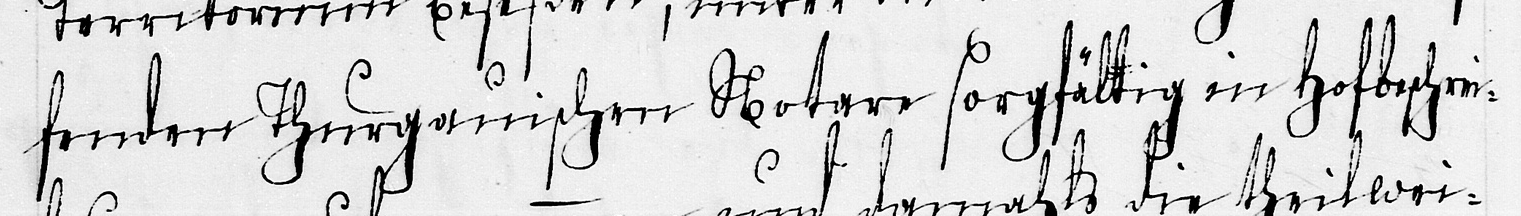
fenden Thurgauischen Notare sorgfältig in Hofbeschre¬
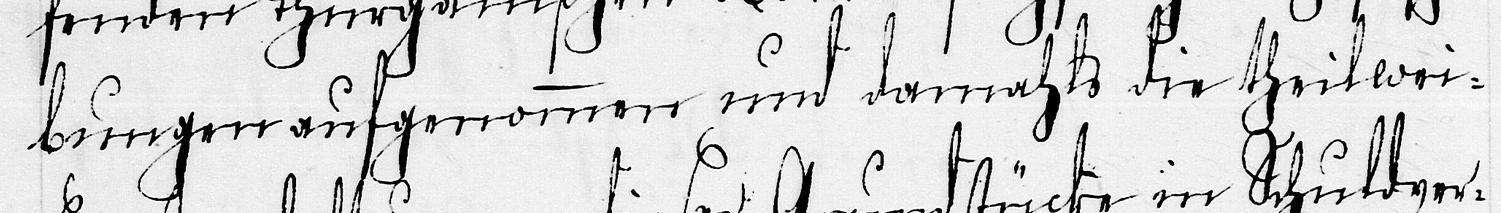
ibungen aufgenommen und damahls die theilwei¬
